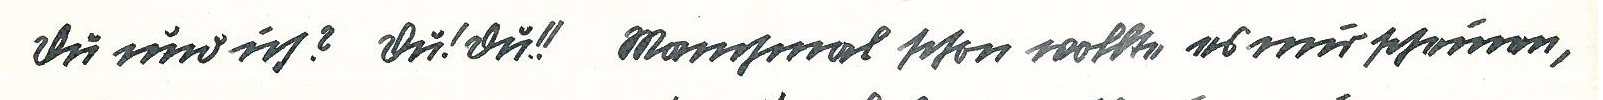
Du und ich? Du! Du!! Manchmal schon wollte es mir scheinen,
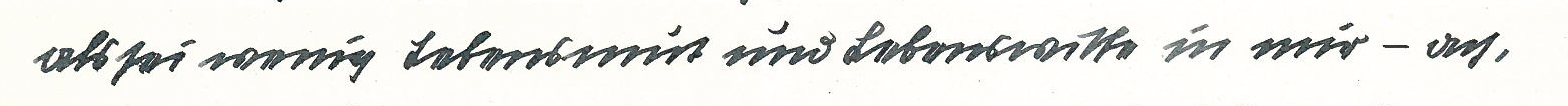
als sei wenig Lebensmut und Lebenswille in mir – ach,
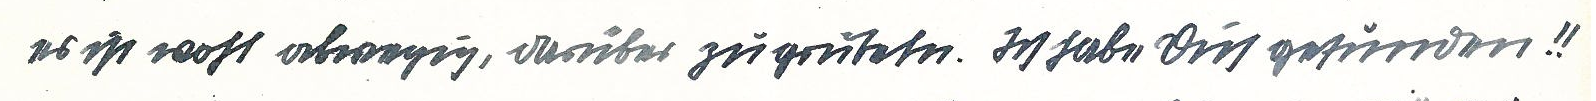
es ist wohl abwegig, darüber zu grübeln. Ich habe dich gefunden!!
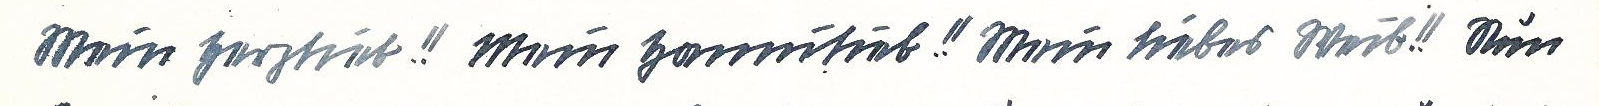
Mein Herzlieb!! Mein lieb!! Mein liebes Weib!! Nun
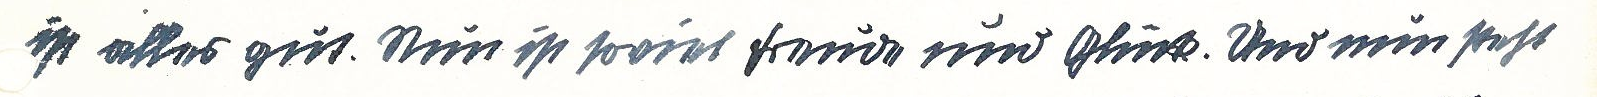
ist alles gut. Nun ist so viel Freude und Glück. Und nun steht
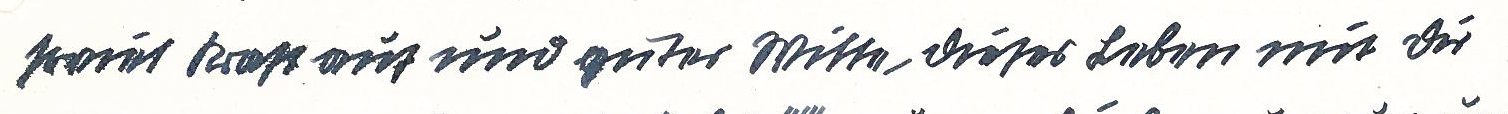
soviel Kraft auf und guter Wille, dieses Leben mit Dir
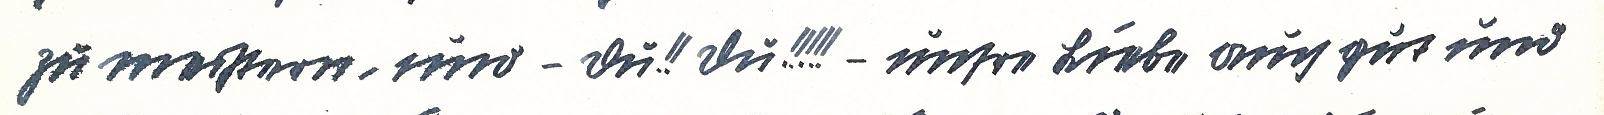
zu meistern, und – Du!! Du!!!!! – unsre Liebe auch gut und
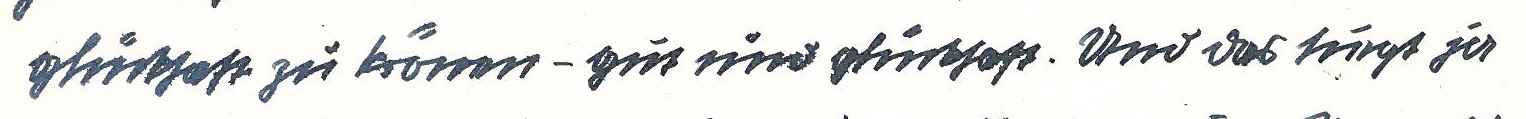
glückhaft zu krönen – gut und glückhaft. Und das liegt ja
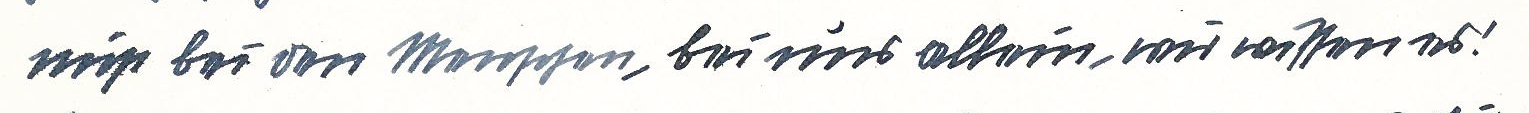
nicht bei den Menschen, bei uns allein, wir wissen es!
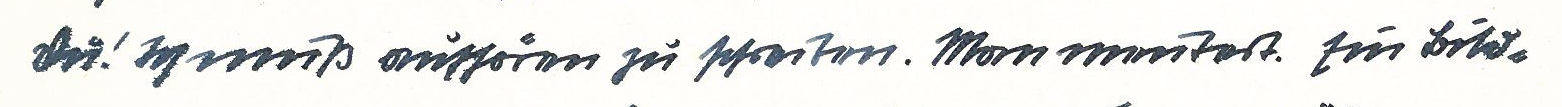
Du! Ich muss aufhören zu schreiben. Man meutert. Ein Bild¬
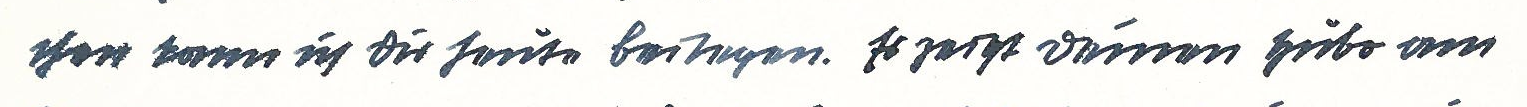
chen kann ich Dir beilegen. Es zeigt Deinen Hubo am
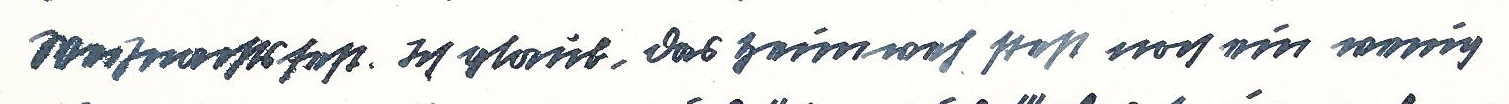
Weihnachtsfest. Ich glaub, das Heimweh steht noch ein wenig
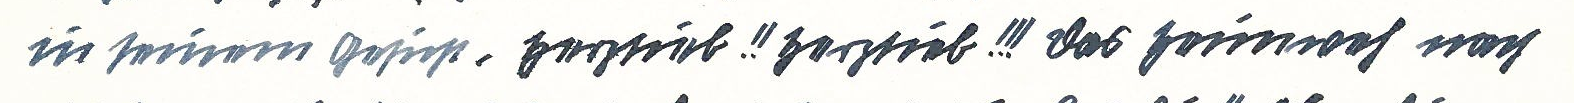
in seinem Gesicht, Herzlieb!! Herzlieb!!! Das Heimweh nach
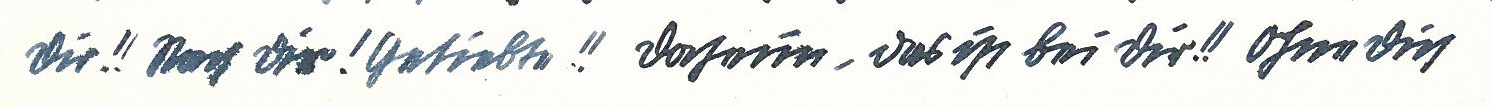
Dir!! Nach Dir! Geliebte!! Daheim, das ist bei Dir!! Ohne Dich
